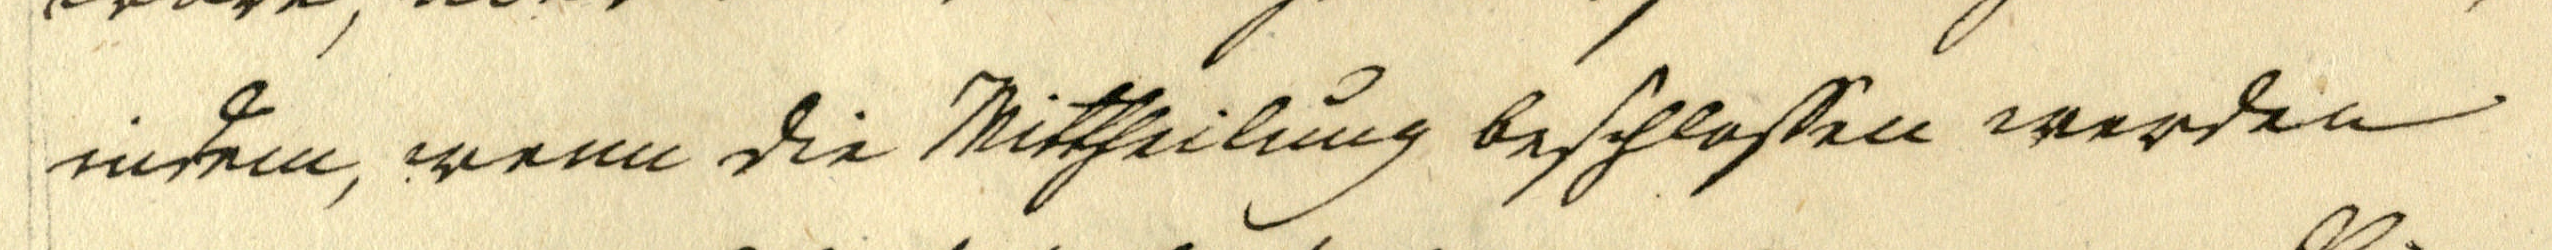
indem, wenn die Mittheilung beschlossen werden
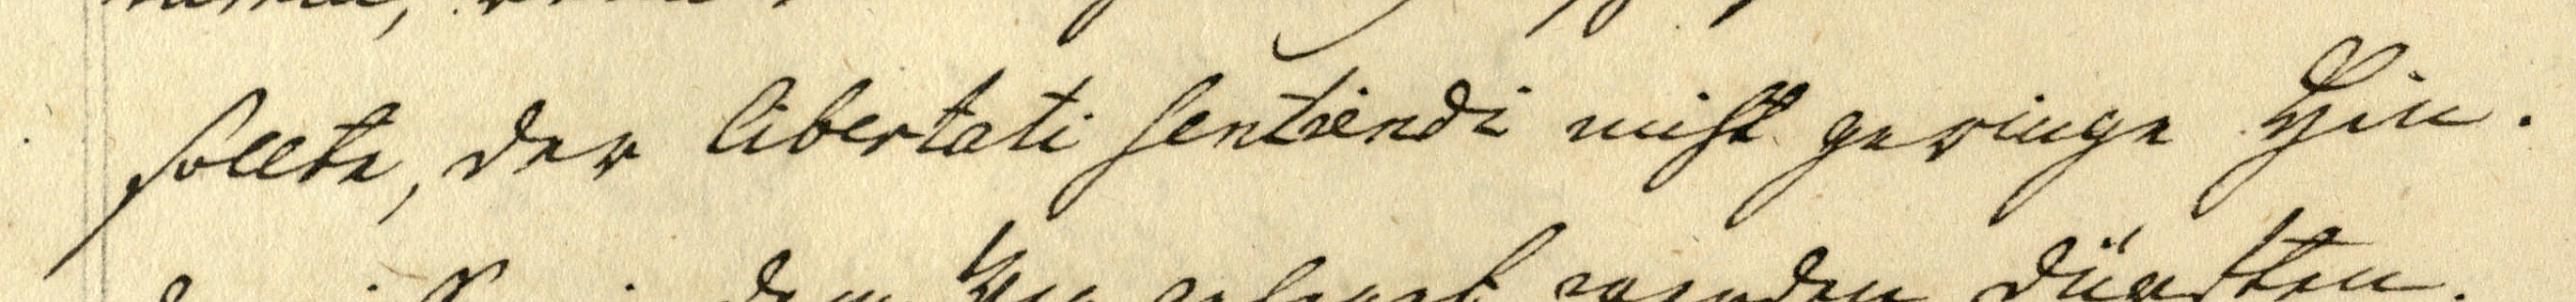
sollte, der libertati sentiendi nicht geringe Hin¬
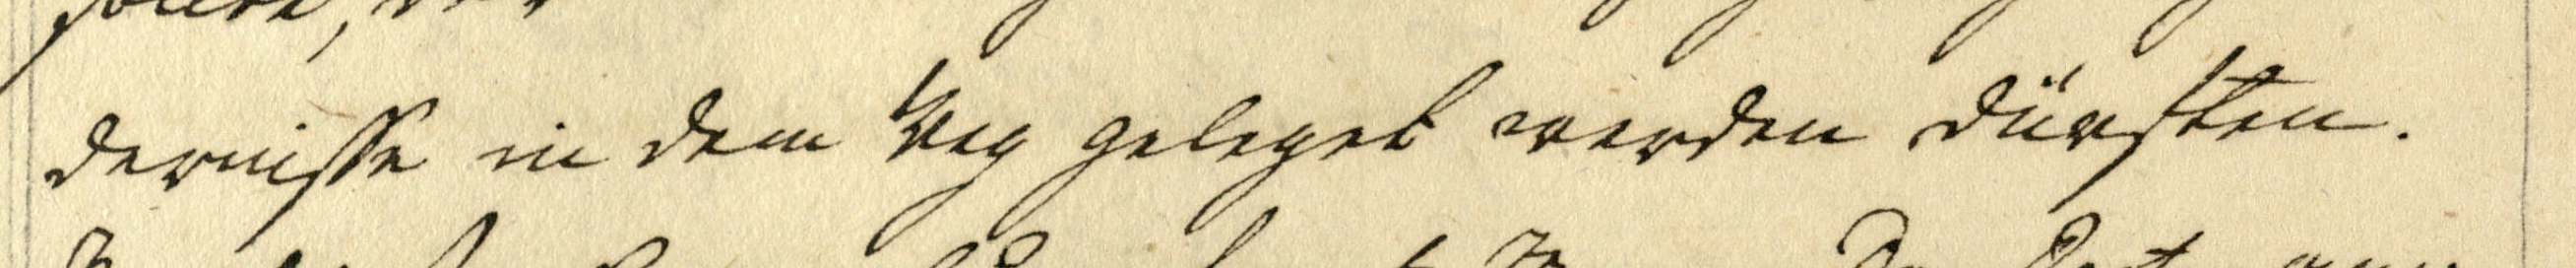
dernisse in dem Weg gelegt werden dürften.
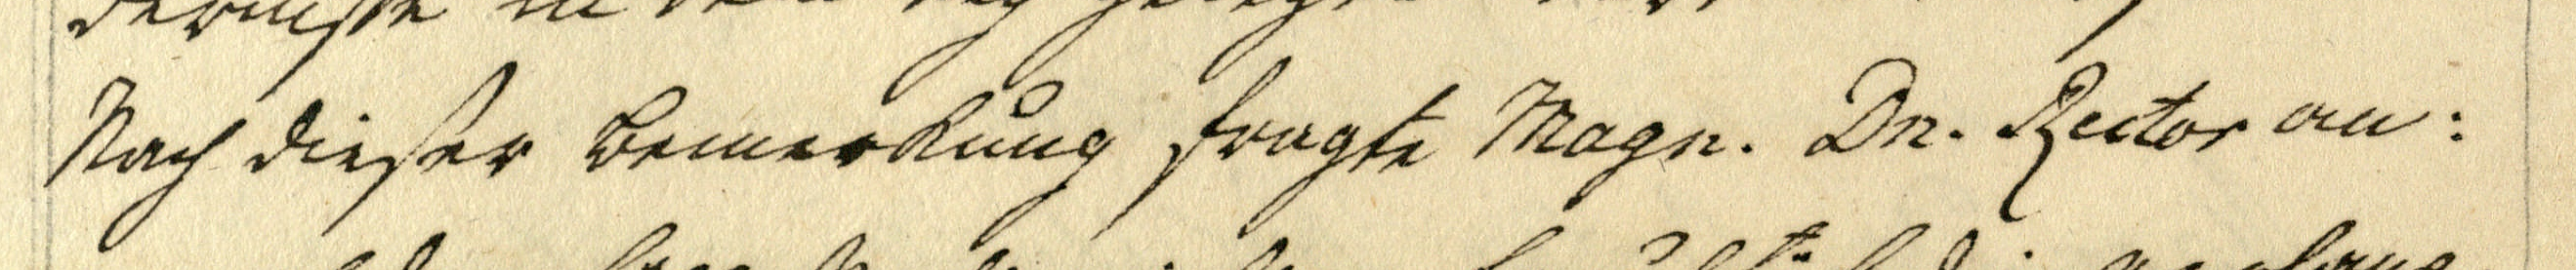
Nach dieser Bemerkung fragte Magn. Dn. Rector an:
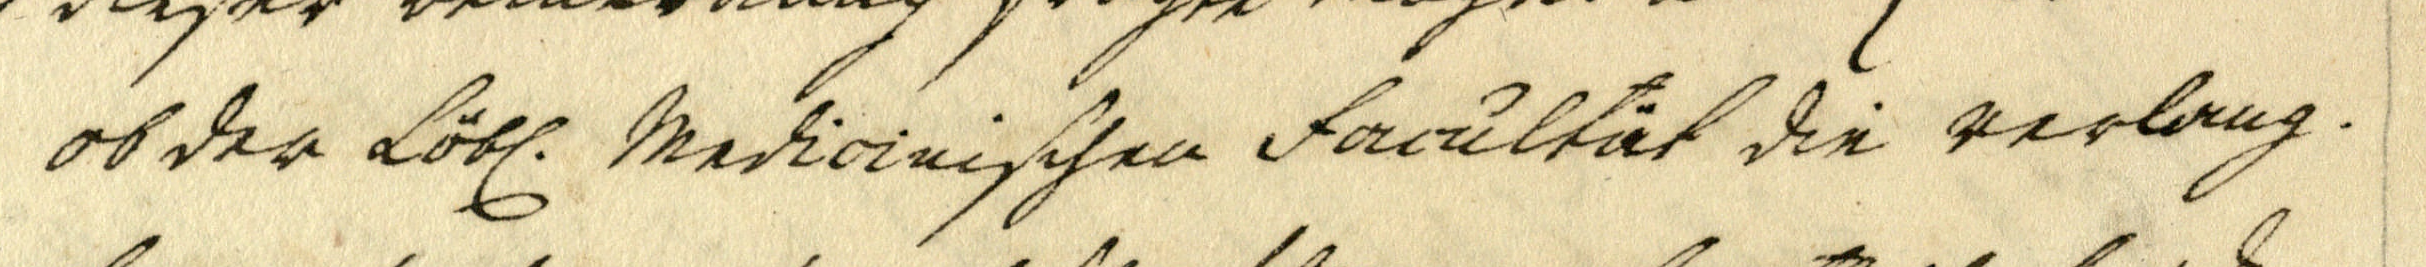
ob der Löbl. Medicinischen Facultät die verlang¬
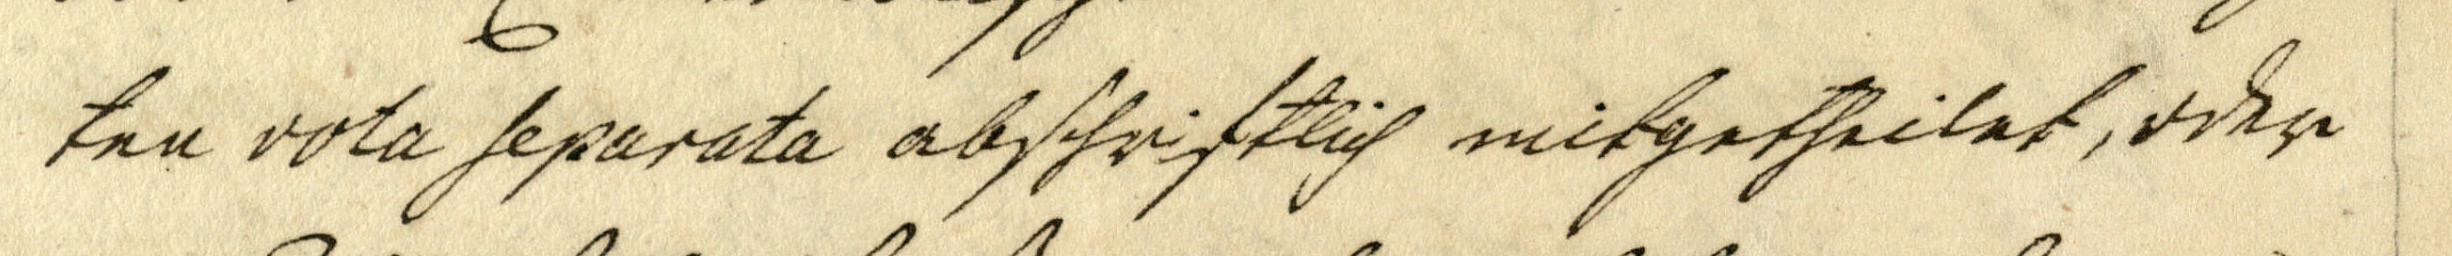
ten vota separata abschriftlich mitgetheilet, oder
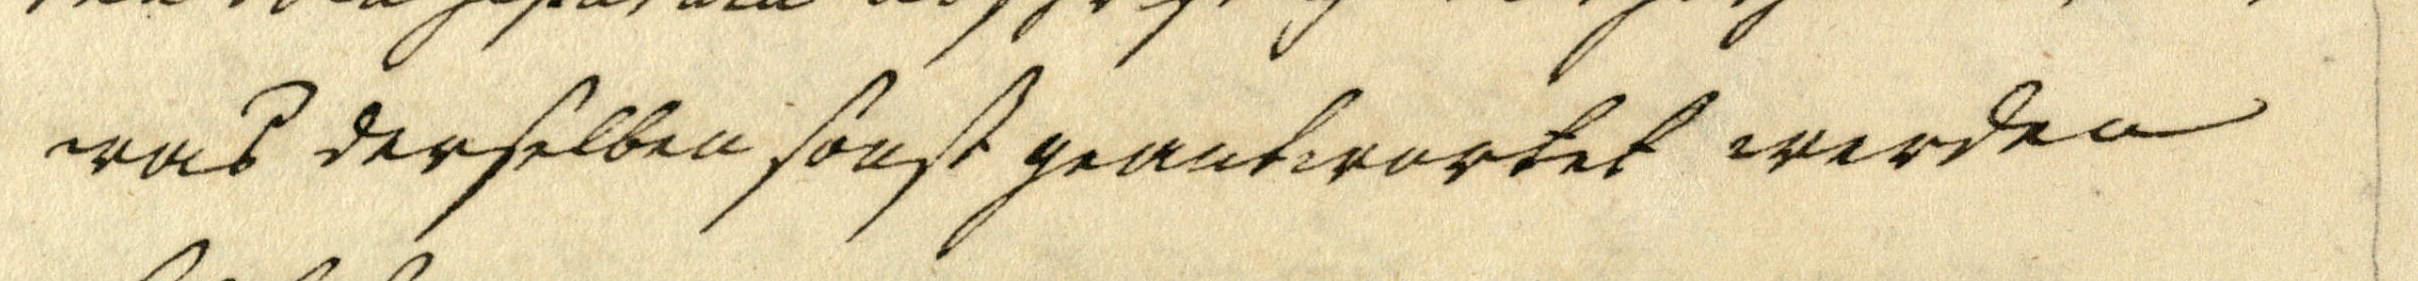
was derselben sonst geantwortet werden
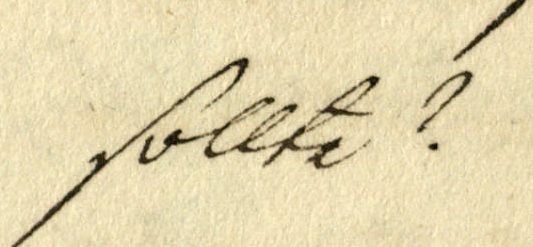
sollte?
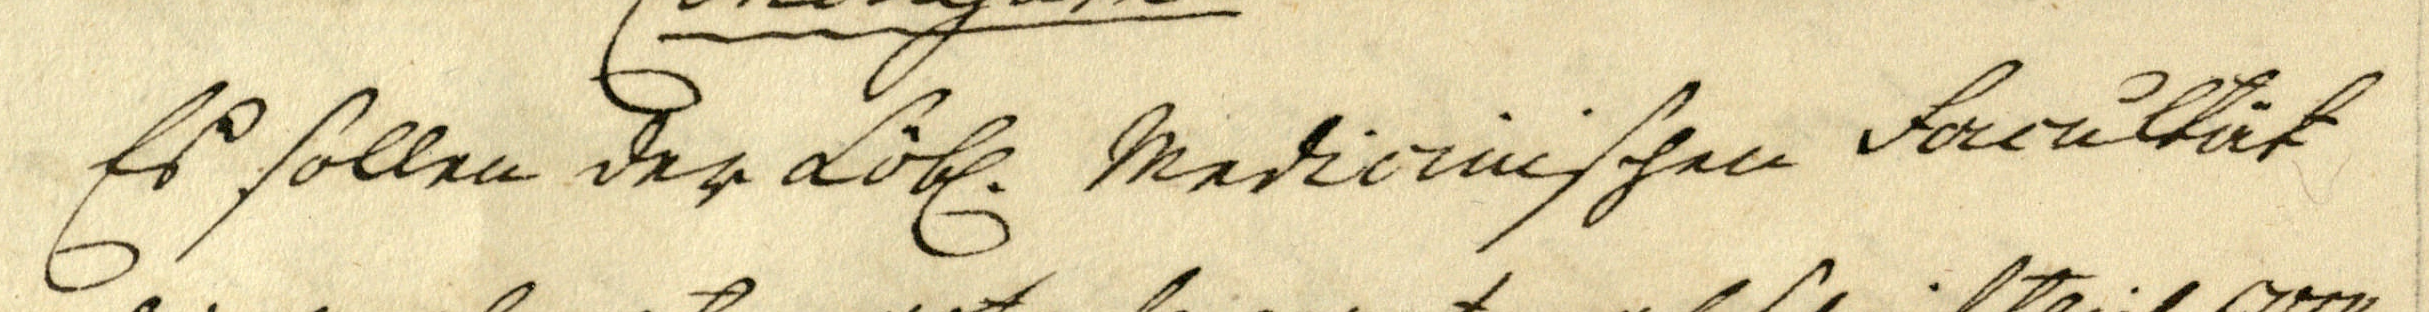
Es sollen der Löbl. Medicinischen Facultät
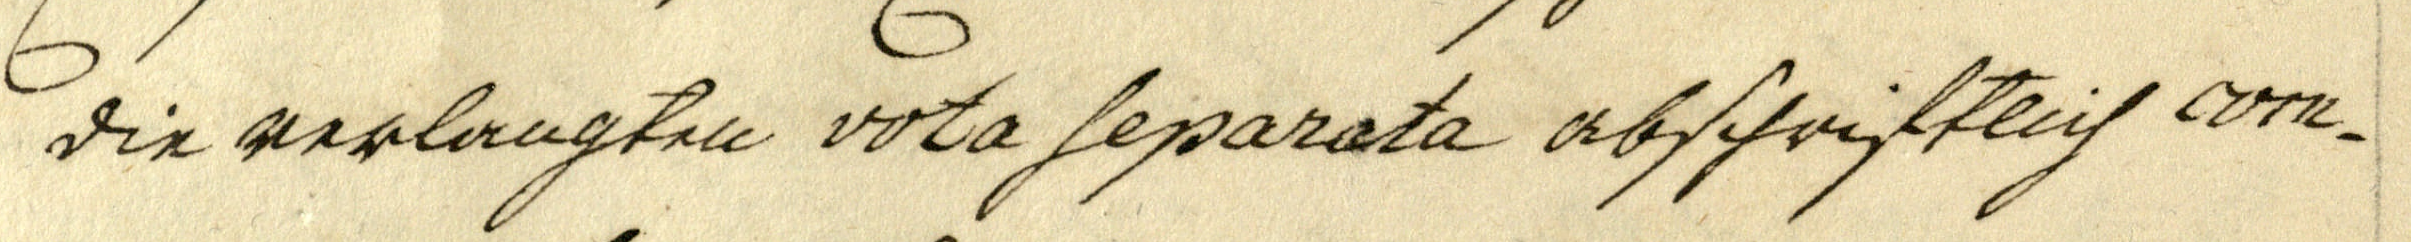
die verlangten vota separata abschriftlich com¬
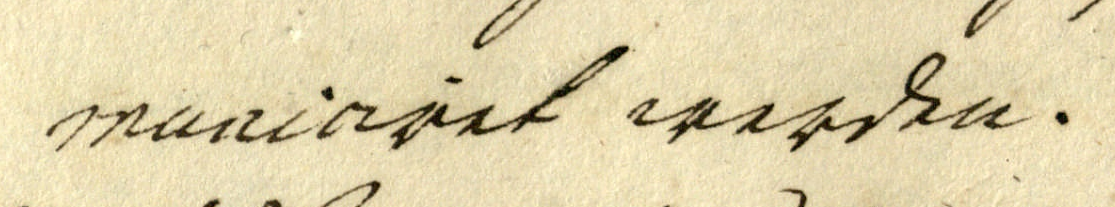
municiret werden.
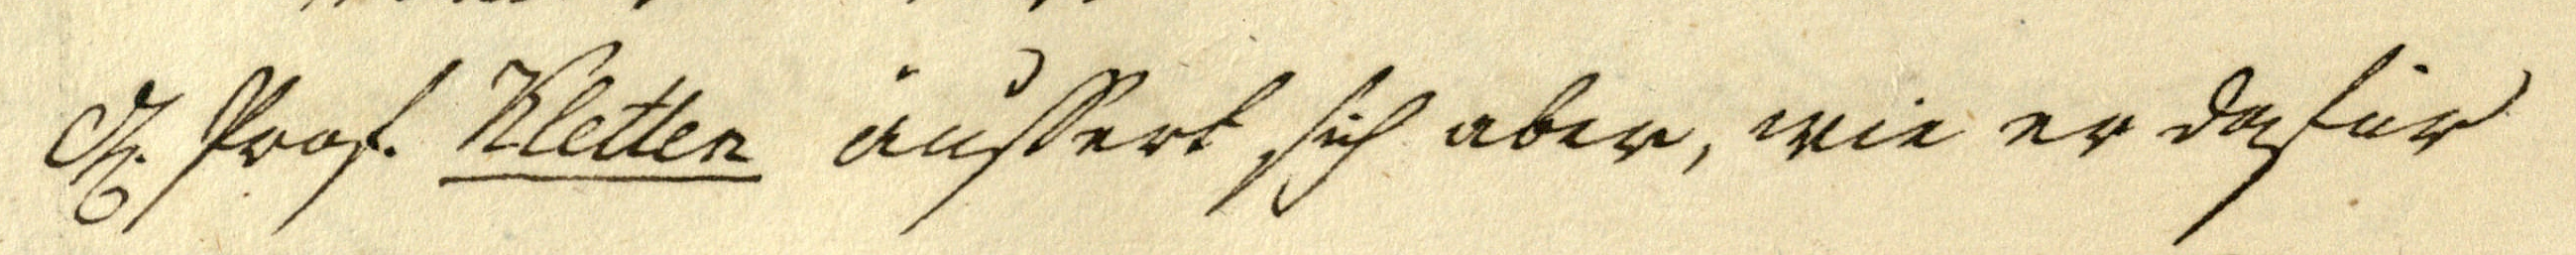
dh. Prof. Kletten äussert sich aber, wie er dafür
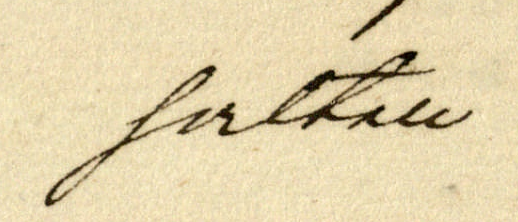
halten
